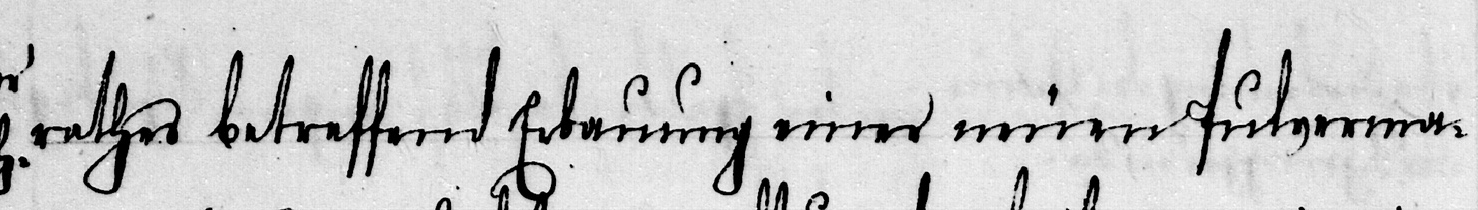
rathes betreffend Erbauung einer neuen Pulverma¬
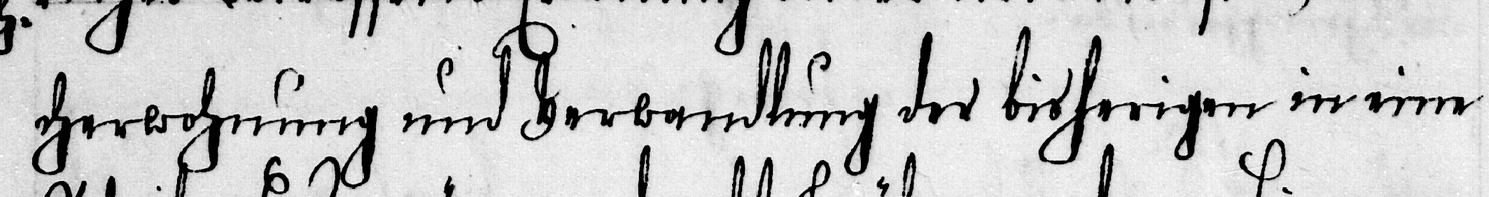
cherwohnung und Verwandlung der bisherigen in eine
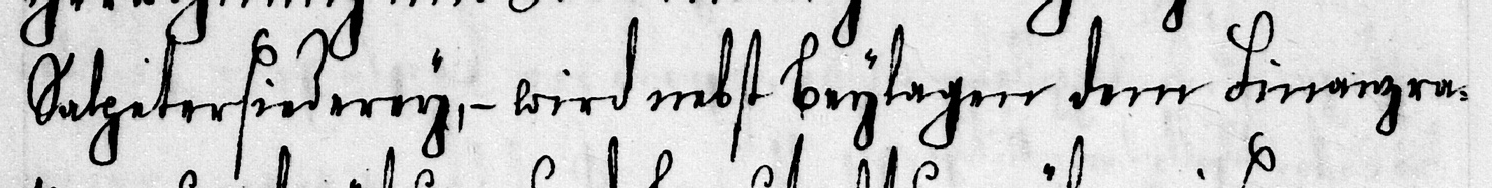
Salpeterfinderey, – wird nebst Beylagen dem Finanzra¬
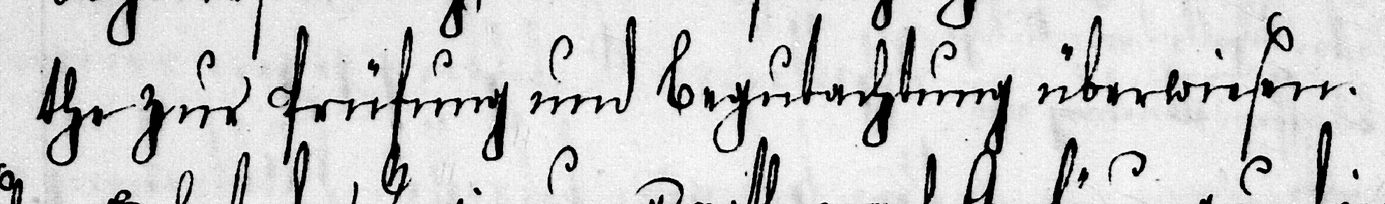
the zur Prüfung und Begutachtung überwiesen.
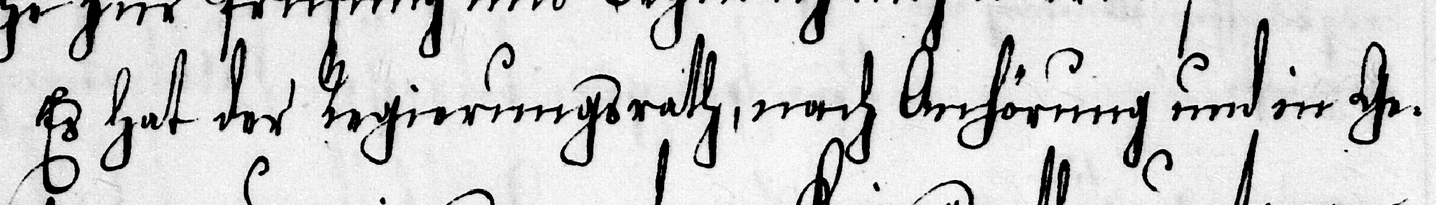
Es hat der Regierungsrath, nach Anhörung und in Ge¬
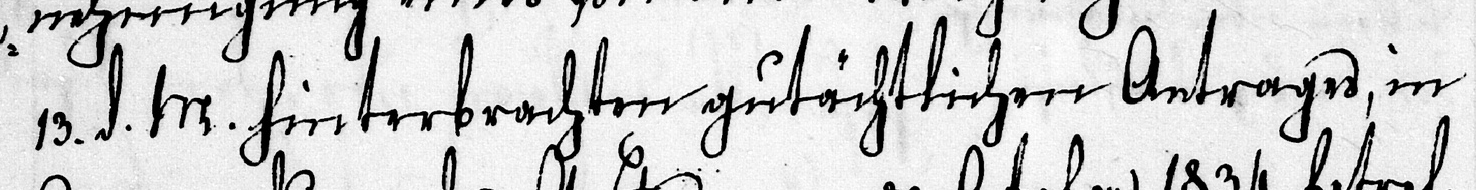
13. d. M. hinterbrachten gutächtlichen Antrages, in
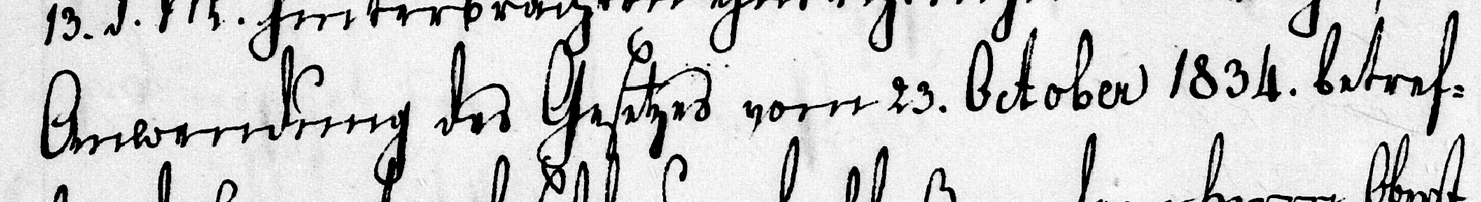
Anwendung des Gesetzes vom 23. October 1834. betref¬
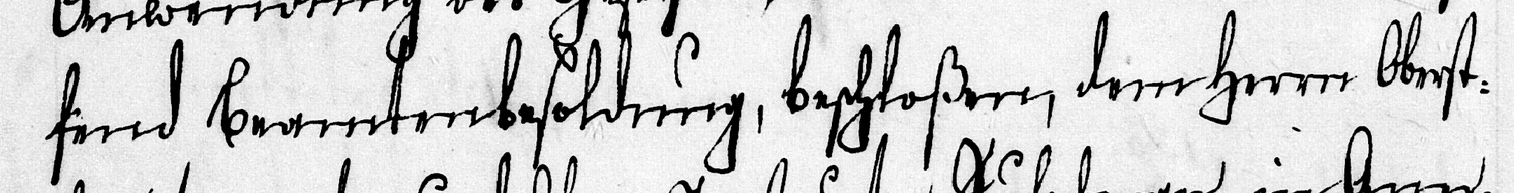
fend Beamtenbesoldung, beschloßen, dem Herrn Obers¬
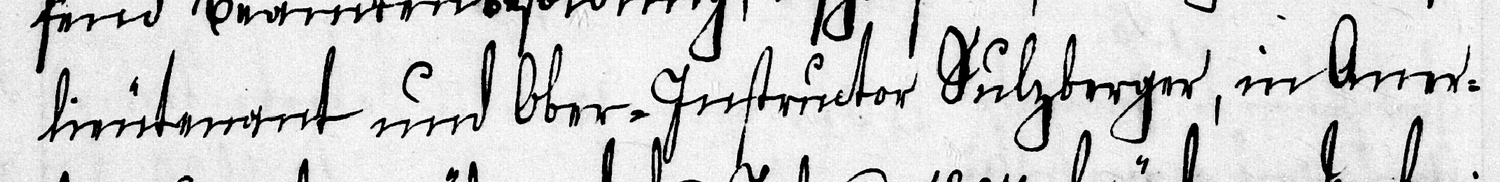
tlieutenant und Ober-Instructor Sulzberger, in Aner¬
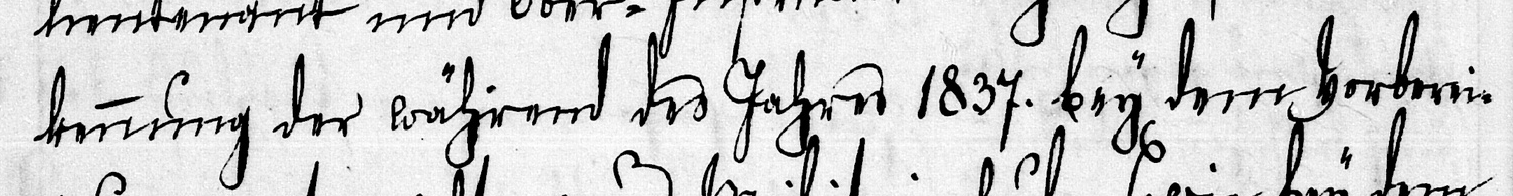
kennung der während des Jahres 1837. bey dem Vorberei¬
